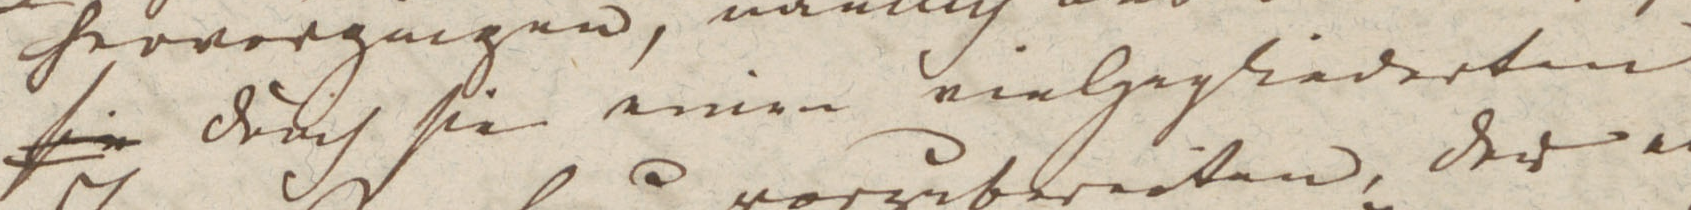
sie durch sie einen vielgegliederten
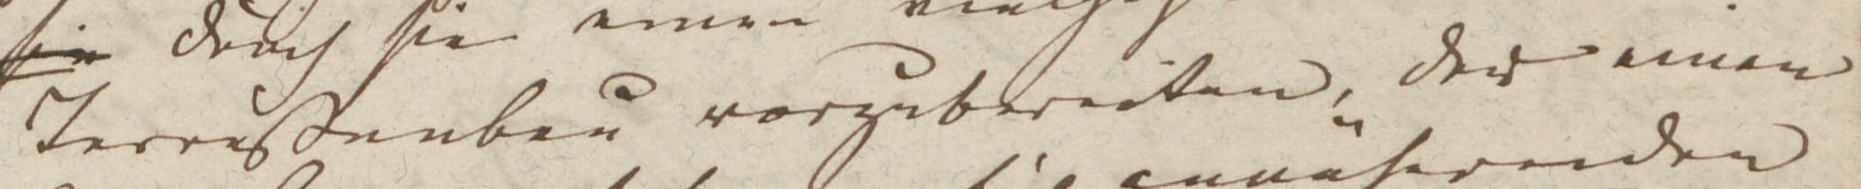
Terrassenbau vorzubereiten, der einen
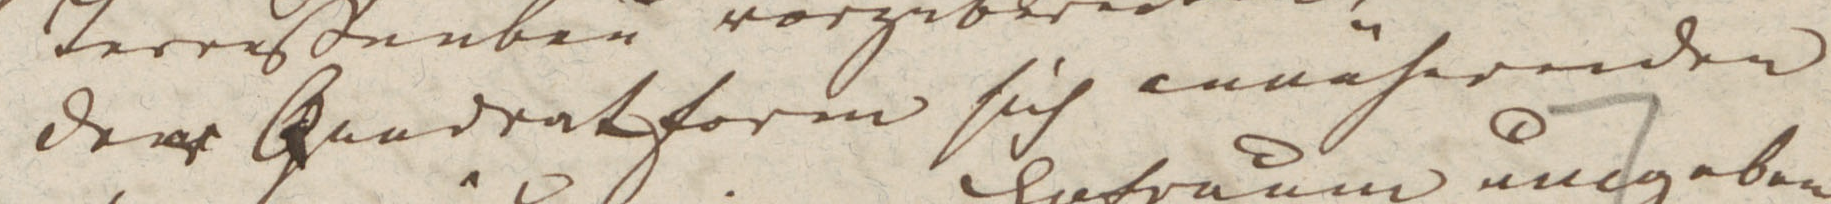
demr uadratform sich annähernden
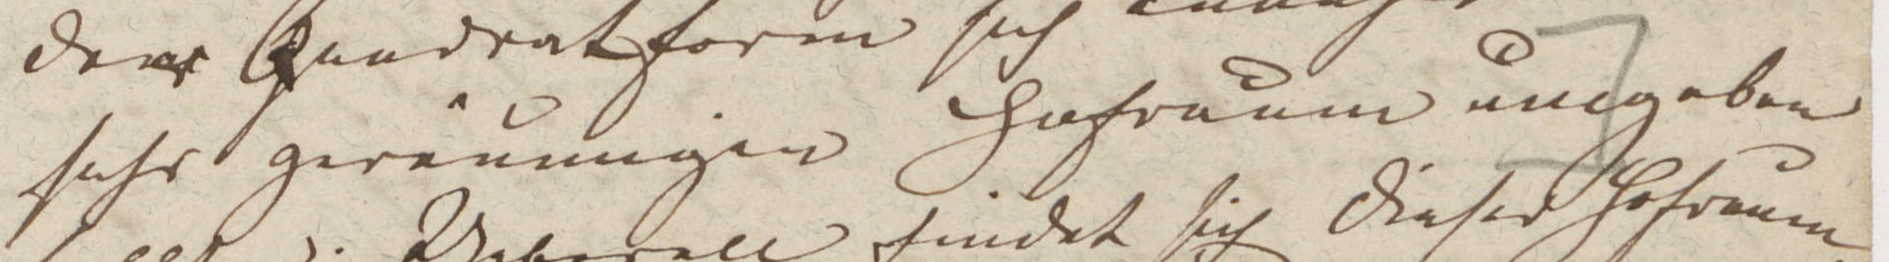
sehr geräumigen Hofraum um%geben
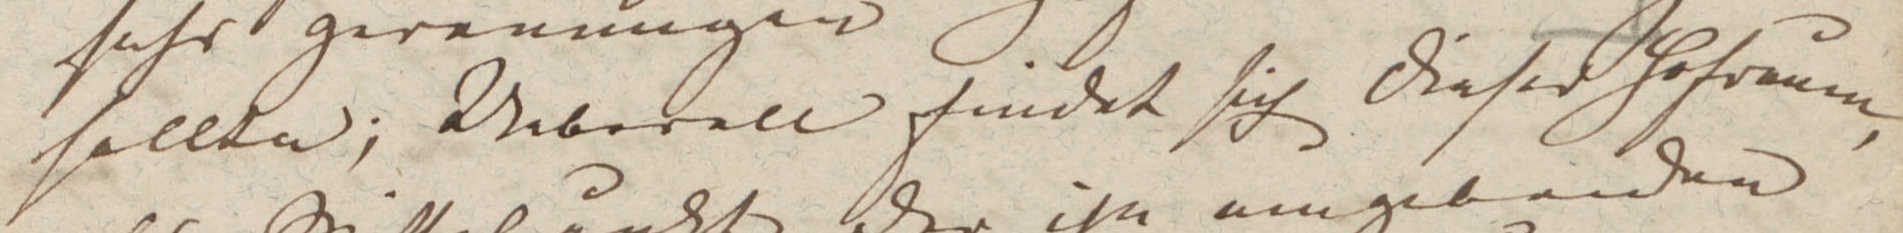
sollte; Ueberall findet sich dieser Hofraum,
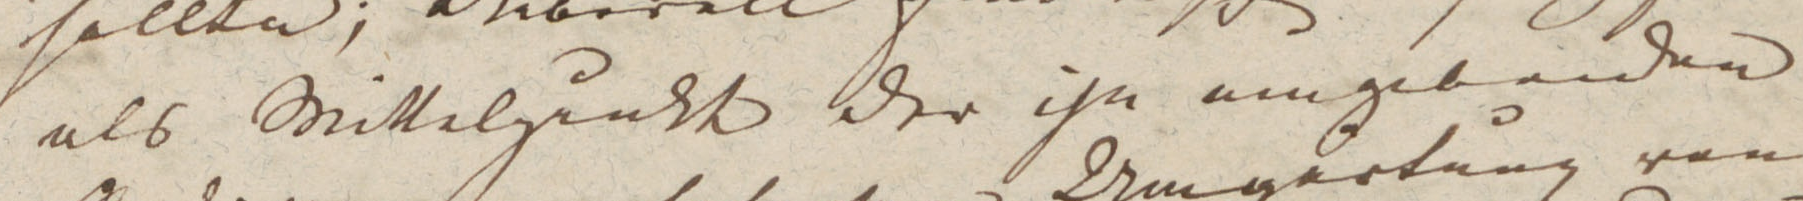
als Mittelpukt der ihn umgebenden
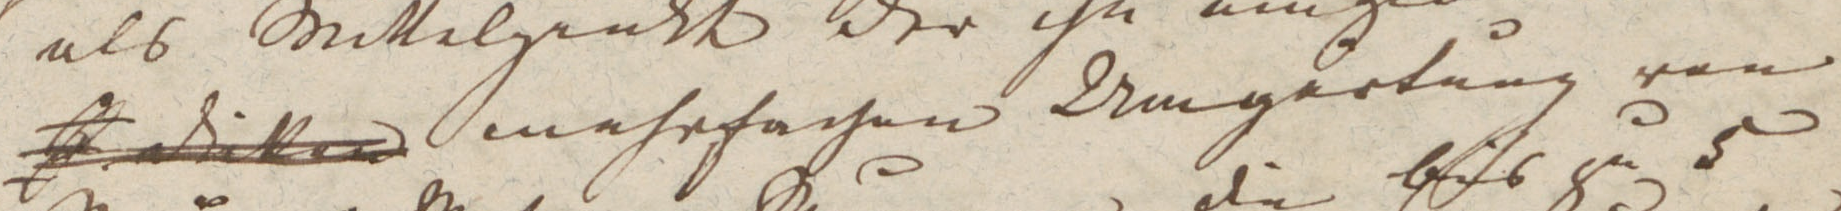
dicken mehrfachen Umgürtung von
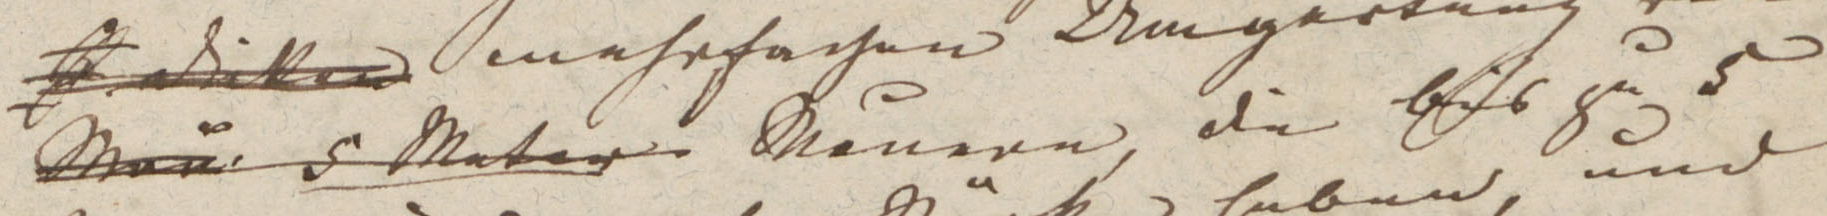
Mau 5 Meter Mauern, die bis zu 5
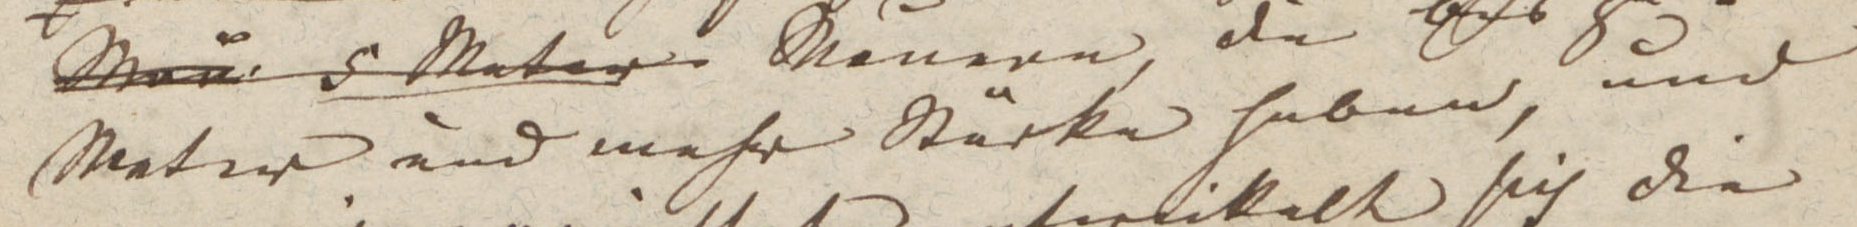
Meter und mehr Stärke haben, und
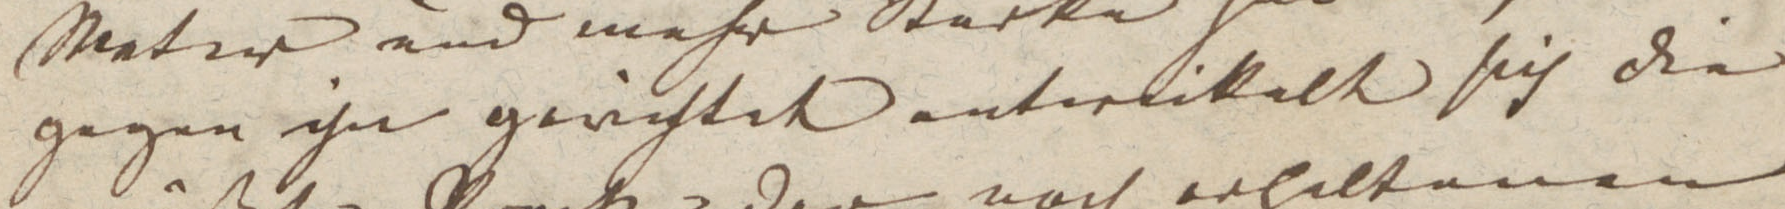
gegen ihn gerichtet entwickelt sich die
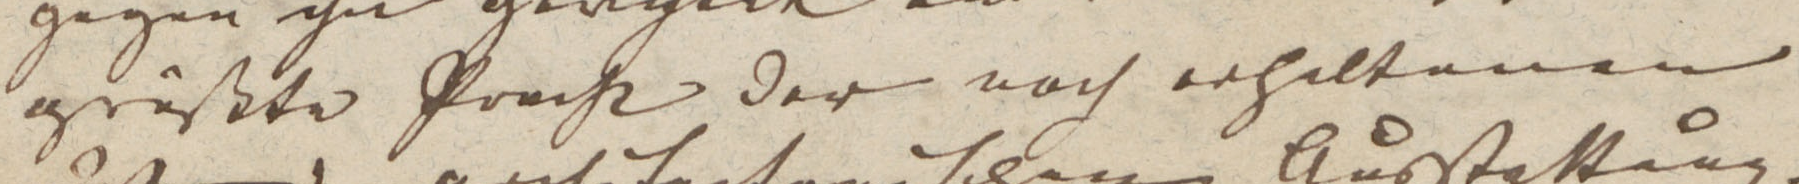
grösste Pracht der noch erhaltenen
